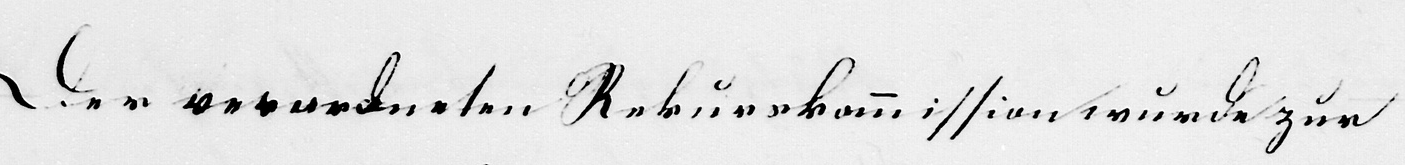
Der verordneten Rekurskommission wurde zur
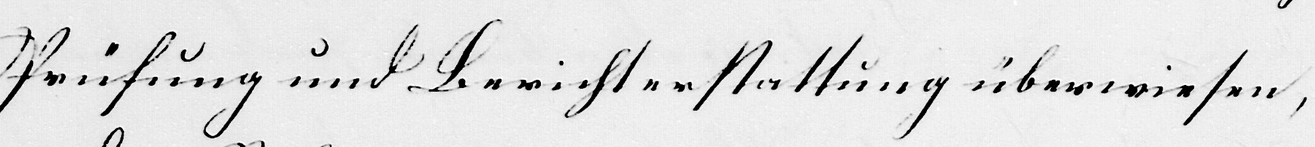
Prüfung und Berichterstattung überwiesen,
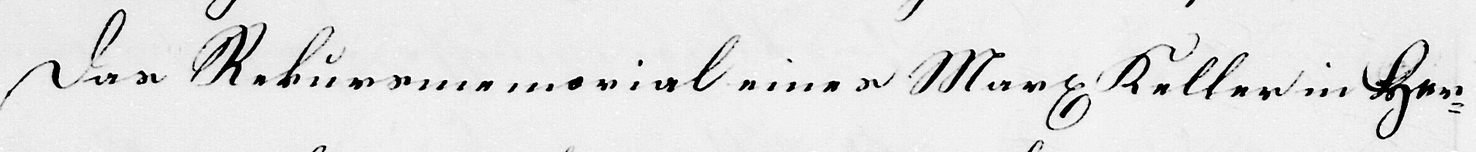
Das Rekursmemorial eines Marx Keller in Her¬
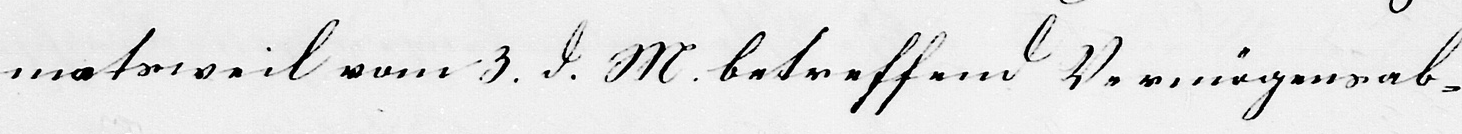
matsweil vom 3. d. M. betreffend Vermögensab¬
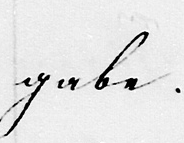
gabe.
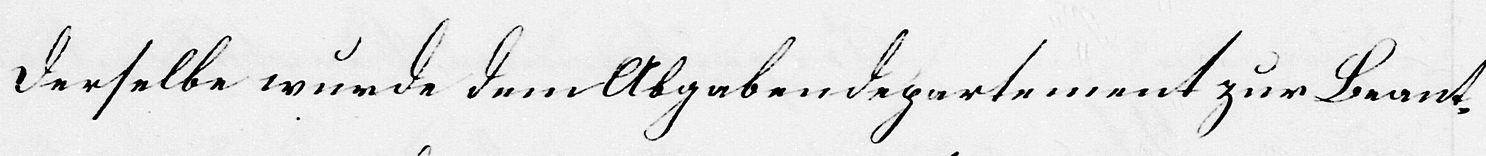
Derselbe wurde dem Abgabendepartement zur Beant¬
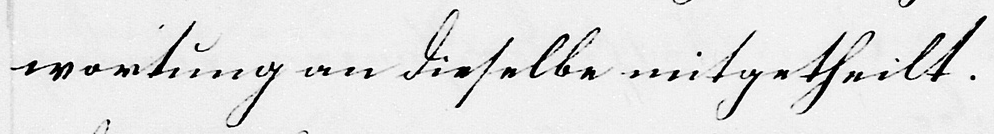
wortung an dieselbe mitgetheilt.
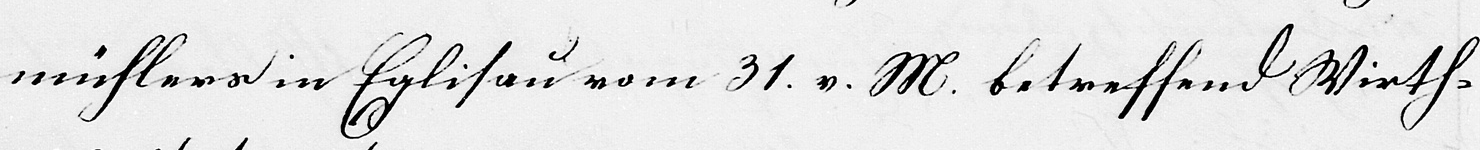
mühlers in Eglisau vom 31. v. M. betreffend Wirth¬
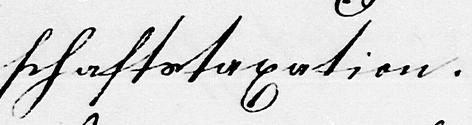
schaftstaxation.
